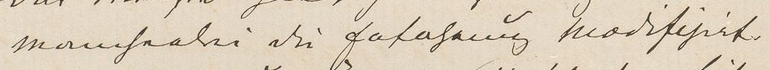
mancherlei die Erfahrung modifizirt.
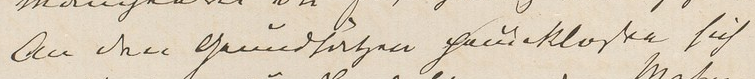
An den Grundsätzen prunkloser sich
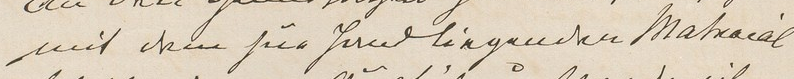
mit dem zur Hand liegenden Material
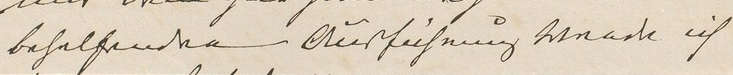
behelfender Ausführung werde ich
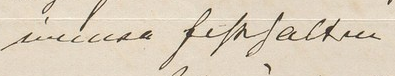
immer festhalten.
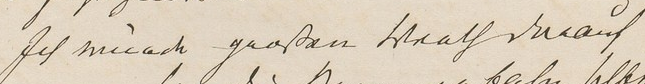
Ich würde großen Werth darauf
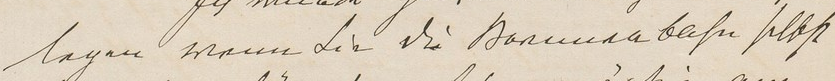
legen wenn Sie die Brennerbahn selbst
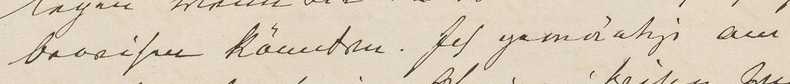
bereisen könnten. Ich gewärtige am
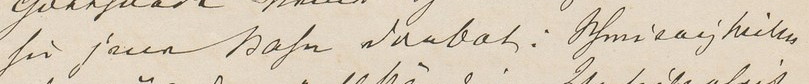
sie jene Bahn darbot: Schwierigkeiten
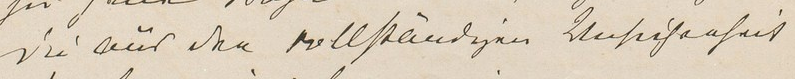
die aus der vollständigen Unsicherheit
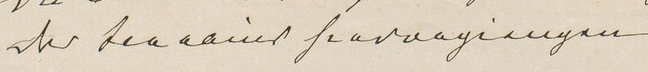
des Terrains hervorgiengen.
